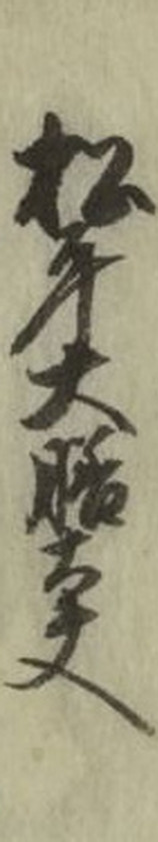松平大膳大夫
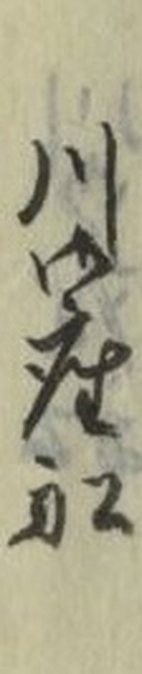川御座船
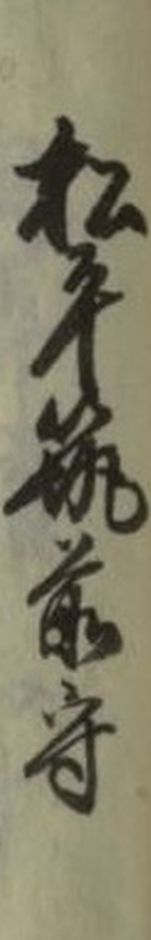松平筑前守
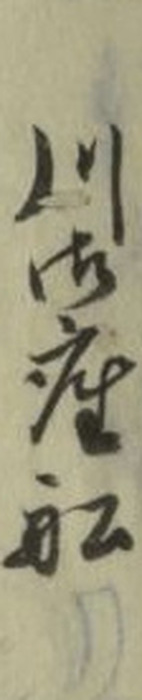川御座船

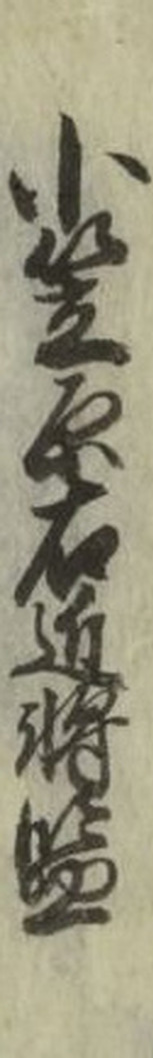小笠原右近将監
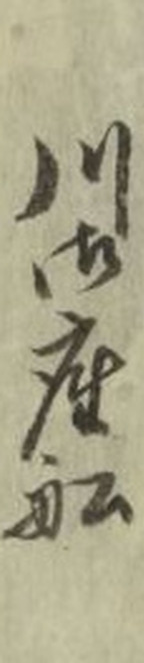川御座船
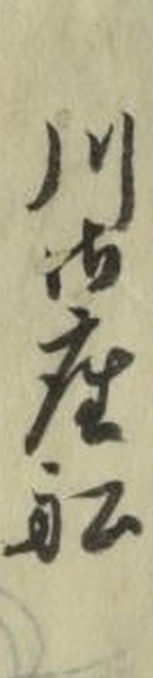川御座船

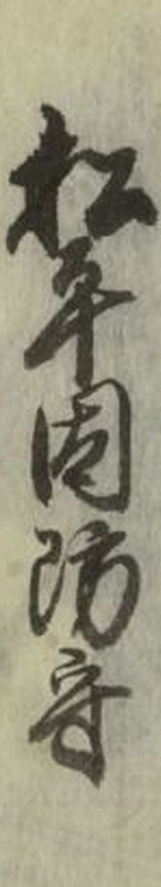松平周防守
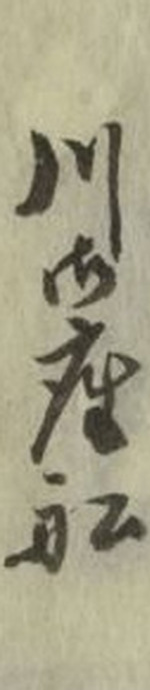川御座船
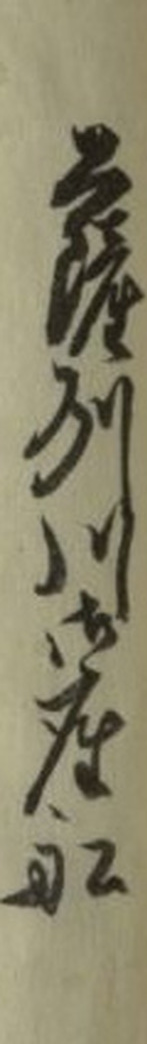薩州川御座船

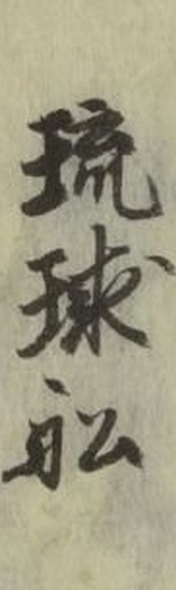琉球船
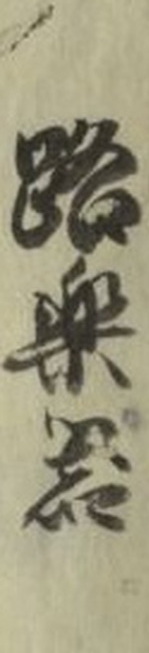路楽器

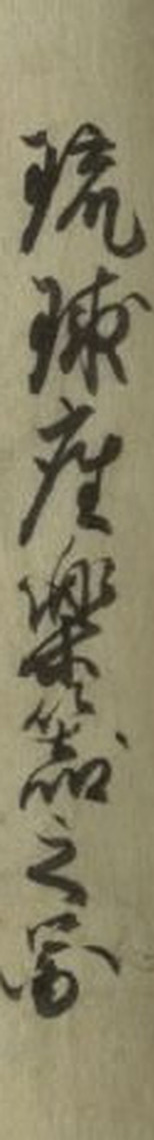琉球座楽篇之図
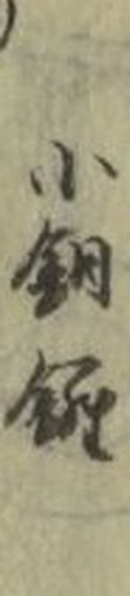小銅鑼
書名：琉球人来朝之記
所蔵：University of the Ryukyus Library
